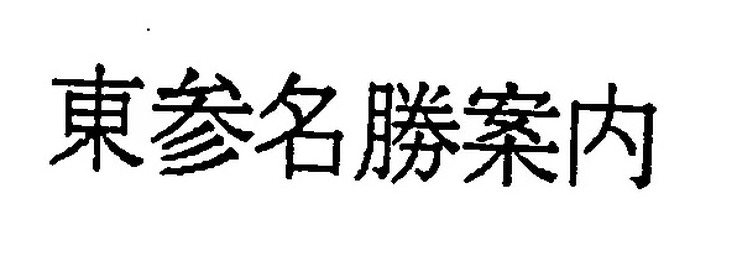東参名勝案内
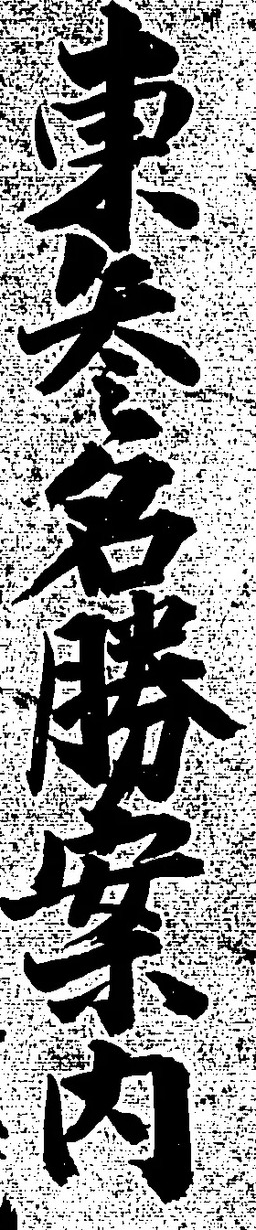東参名勝案内
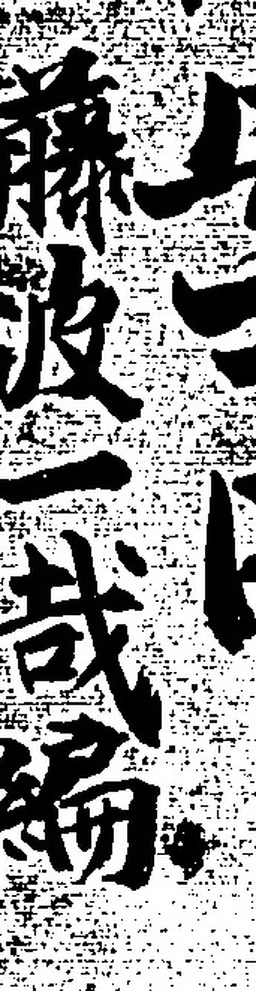藤波一哉編

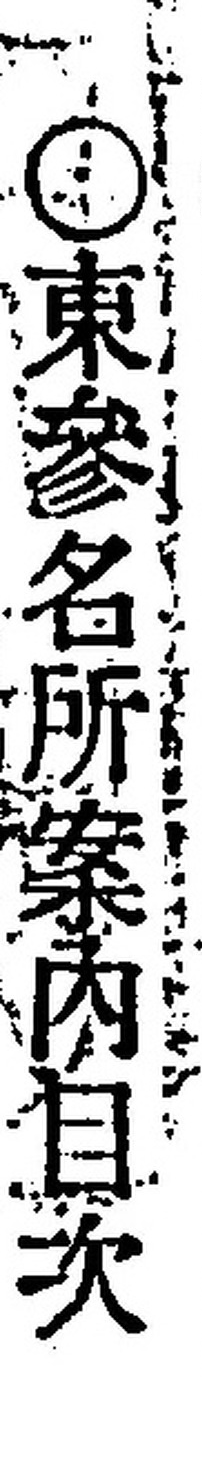○東参名所案内目次
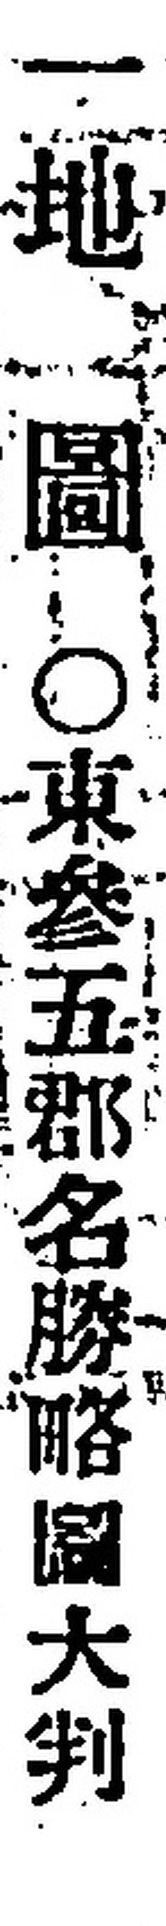一地図○東参五郡名勝略図大判
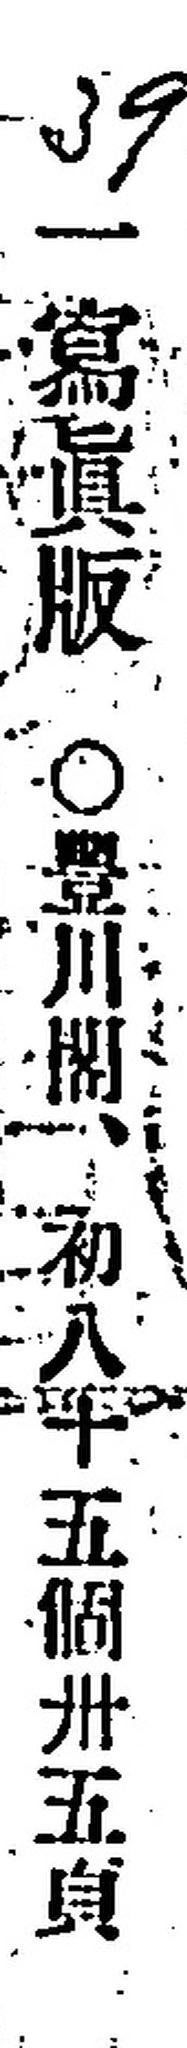一写真版○豊川閣、初八十五個卅五頁
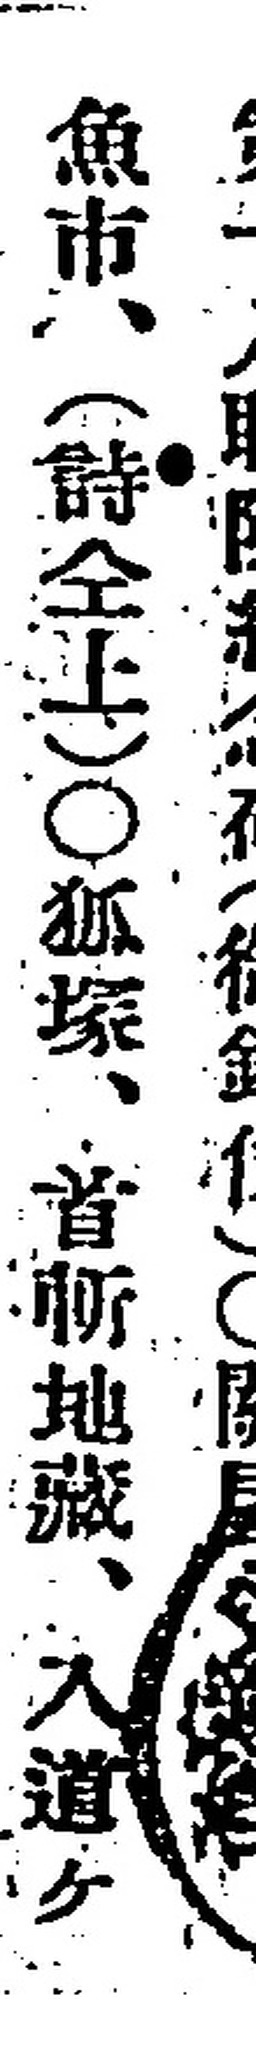魚市、(詩仝上)○狐塚、首斬地蔵、入道ヶ
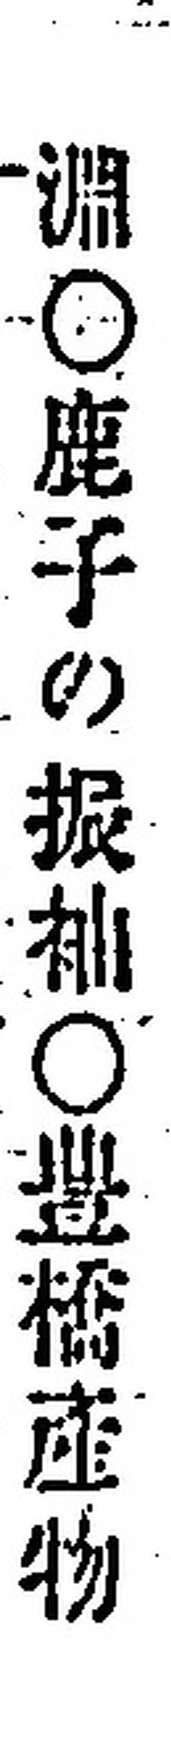淵○鹿子の振袖○豊橋産物
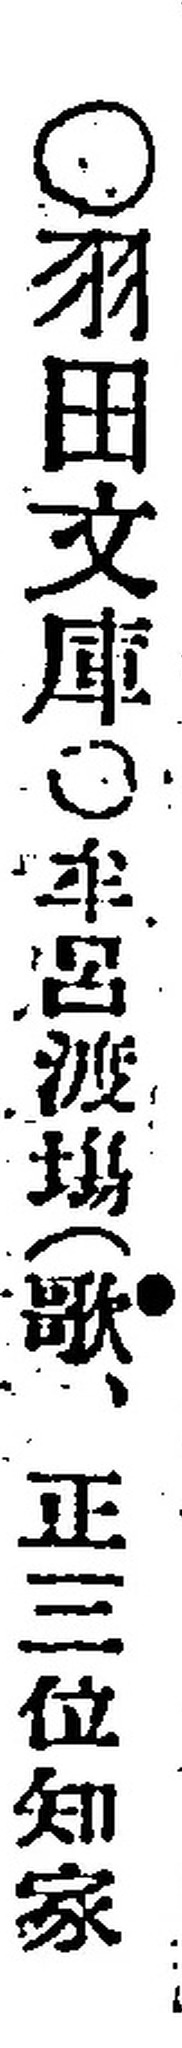○羽田文庫○牟呂渡場(歌、正三位知家
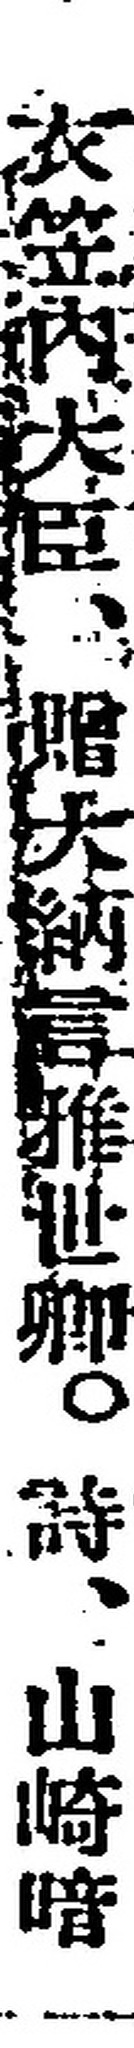衣笠内大臣、贈大納言雅世卿。詩、山崎暗
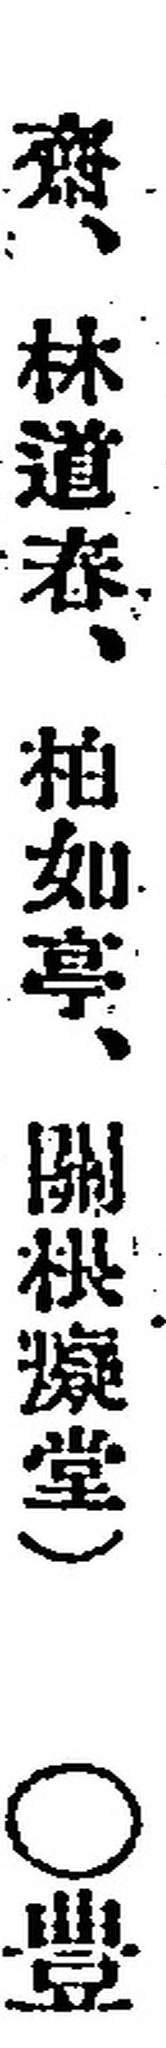齋、林道春、柏如亭、関根痴堂)○豊
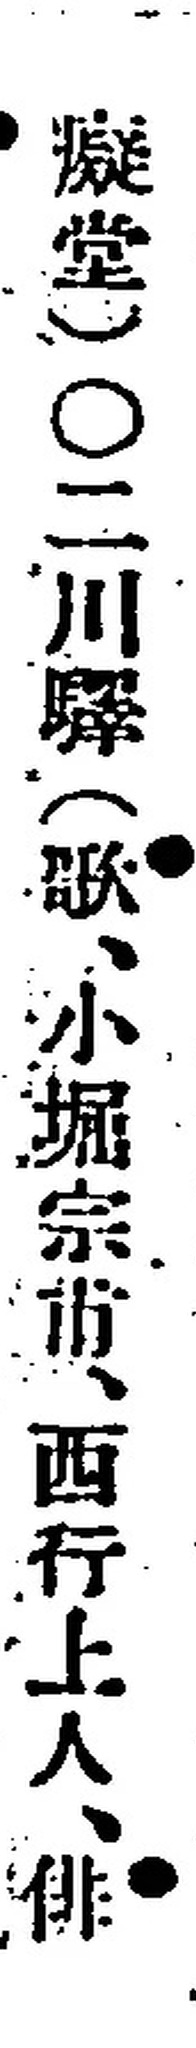痴堂)○二川駅(歌、小堀宗甫、西行上人、俳
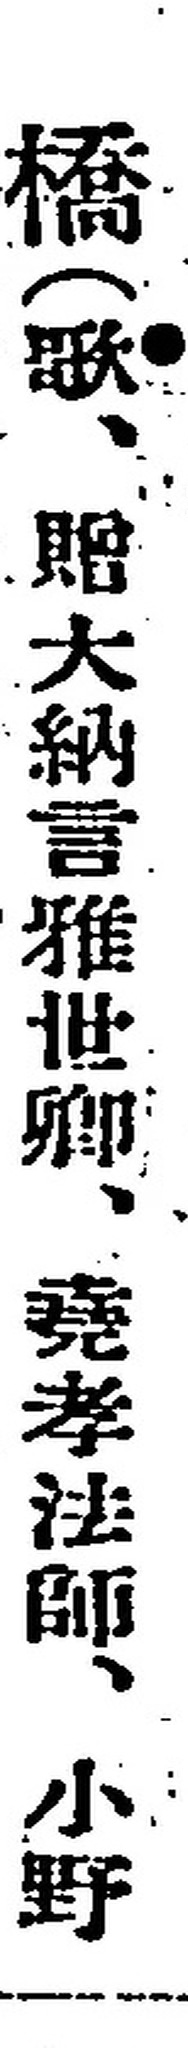橋(歌、贈大納言雅世卿、尭孝法師、小野
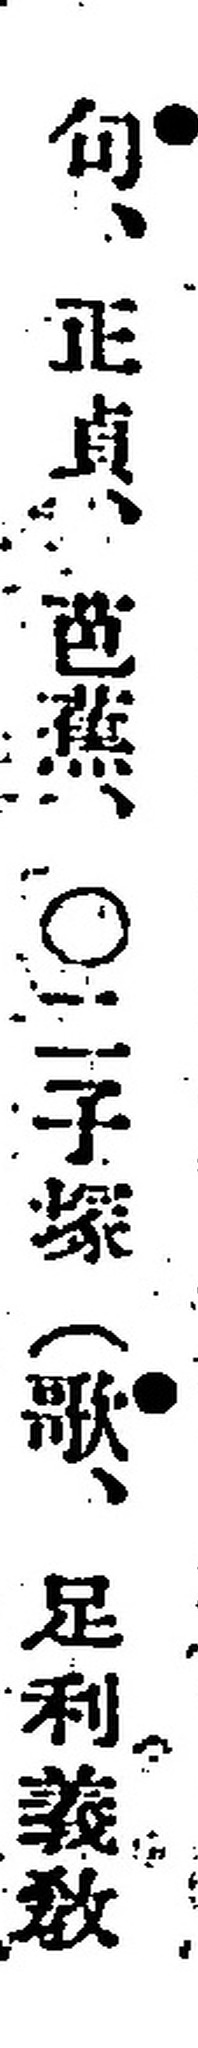句、正貞、芭蕉、○二子塚(歌、足利義教
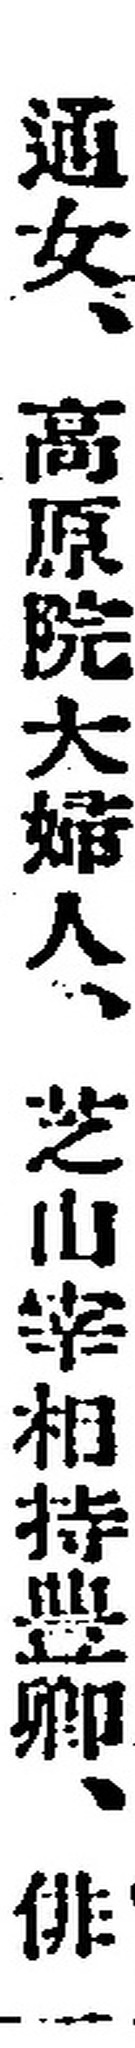通女、高原院大婦人、芝山宰相持豊卿、俳
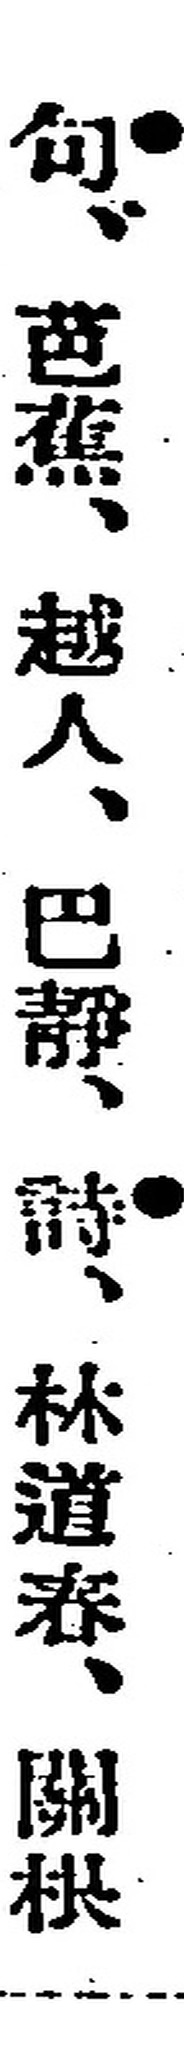句、芭蕉、越人、巴静、詩、林道春、関根
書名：東参名勝案内
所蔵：国立国会図書館 National Diet Library, JAPAN
